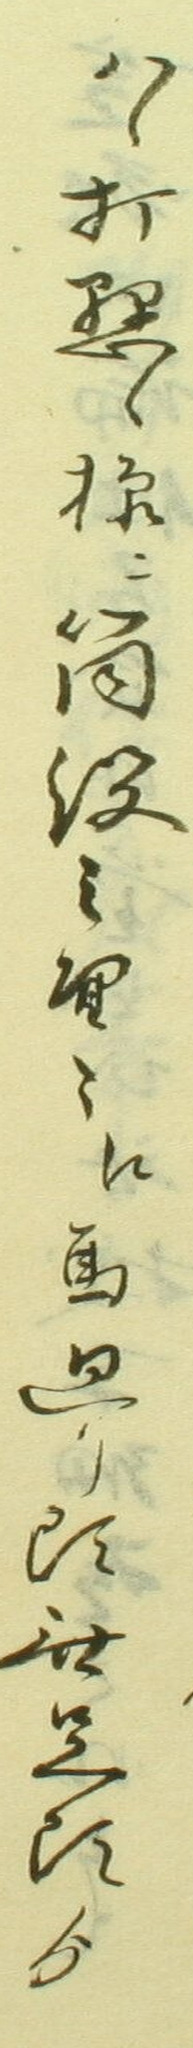はゝ打懸候様ニ筒役之面々江馬廻り頭無足頭ゟ
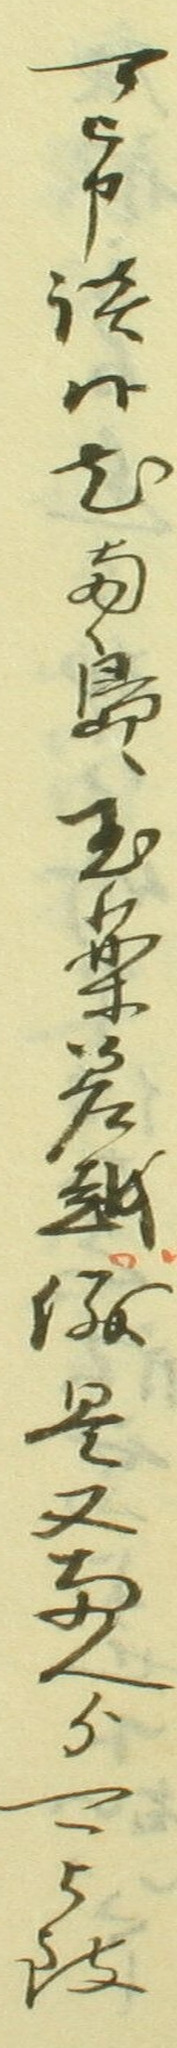可被申談候尤両島へ玉薬差越候儀是又両人ゟ可被致
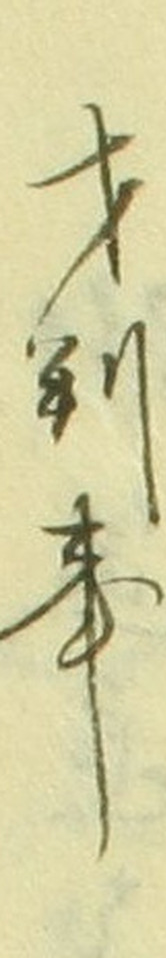才判事
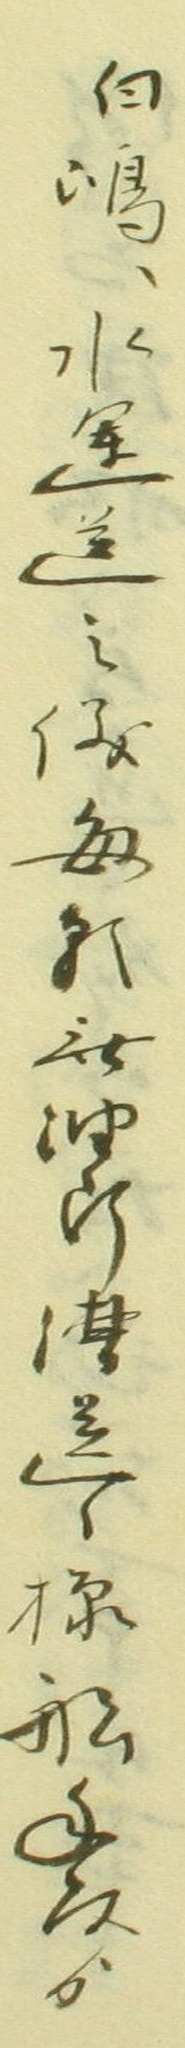一白島へ水運送之儀毎願無油断漕送候様船手殿ゟ
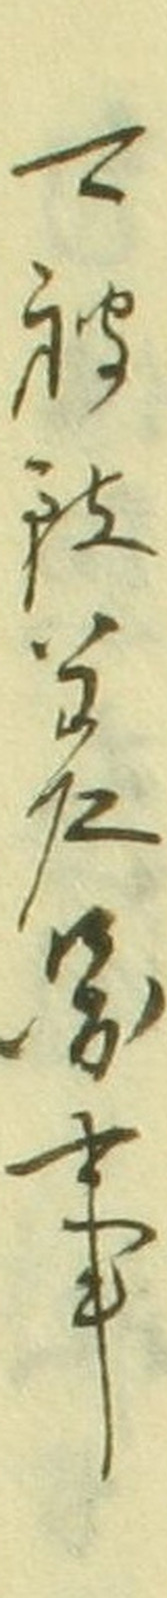可被致差図事
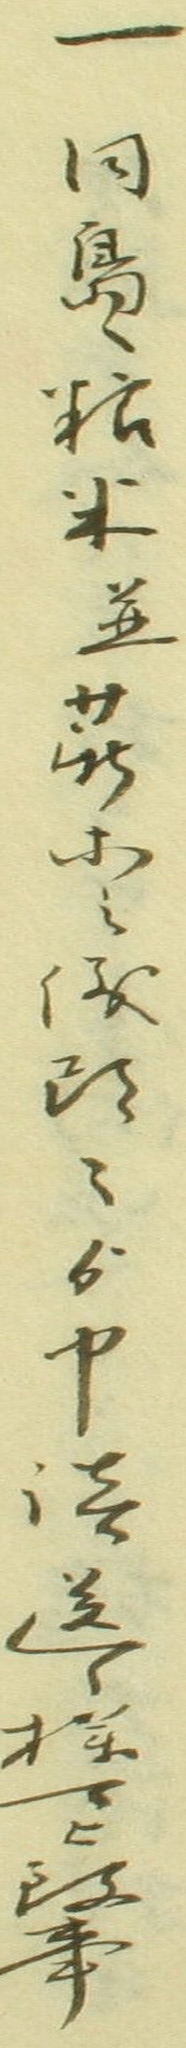一同島へ糧米並薪等之儀頭々ゟ申談送候様可被致事
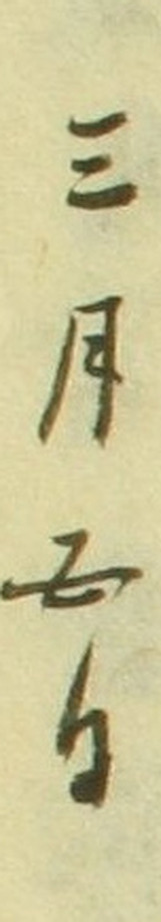三月五日
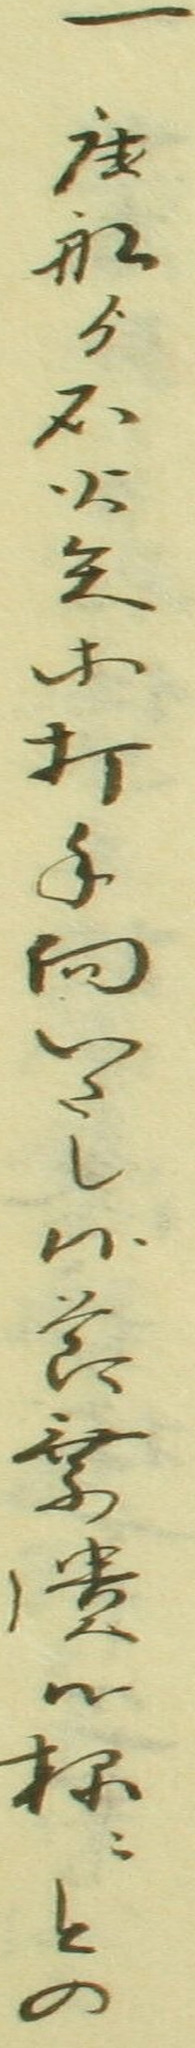一唐船ゟ石火矢等打手向いたし候節乗潰候様にとの
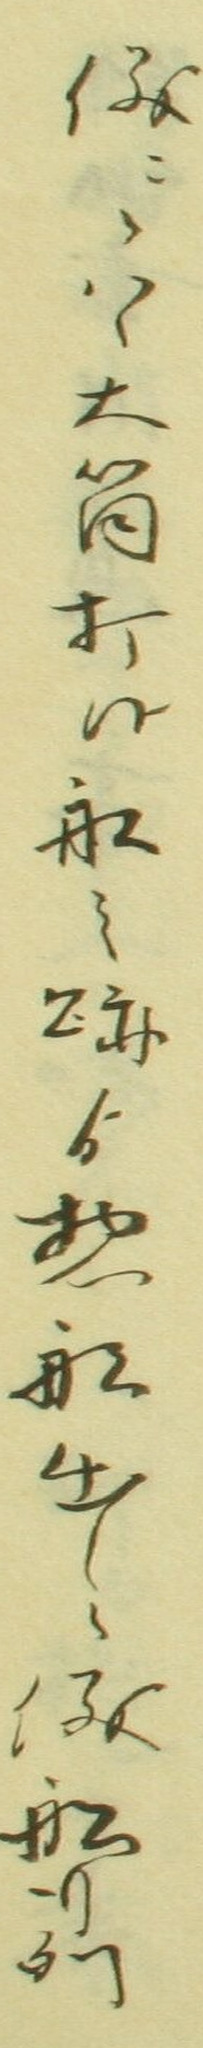儀に候はゝ大筒打候船之跡ゟ惣船出候儀船行列

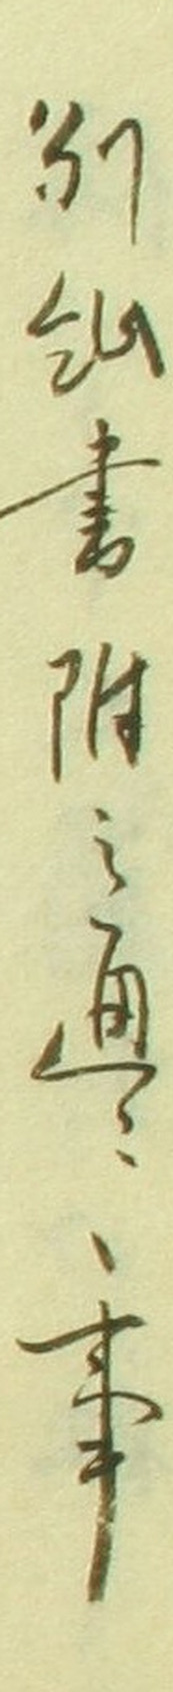別紙書附之通ニ候事
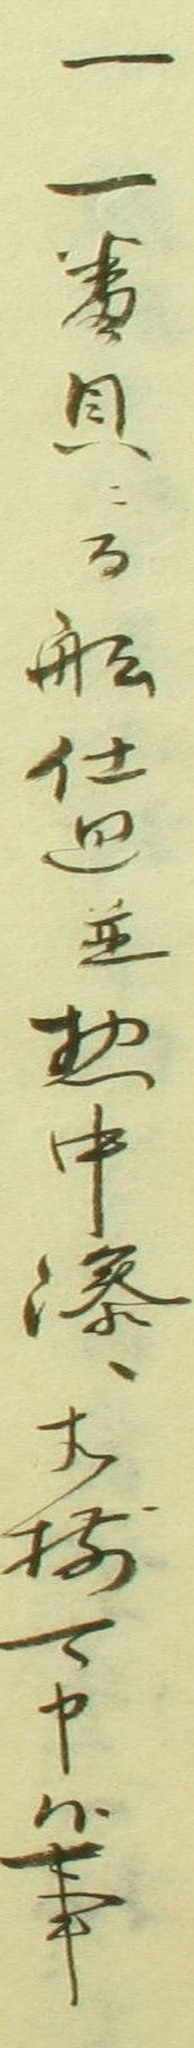一一番貝ニ而船仕廻並惣中湊へ相揃可申候事
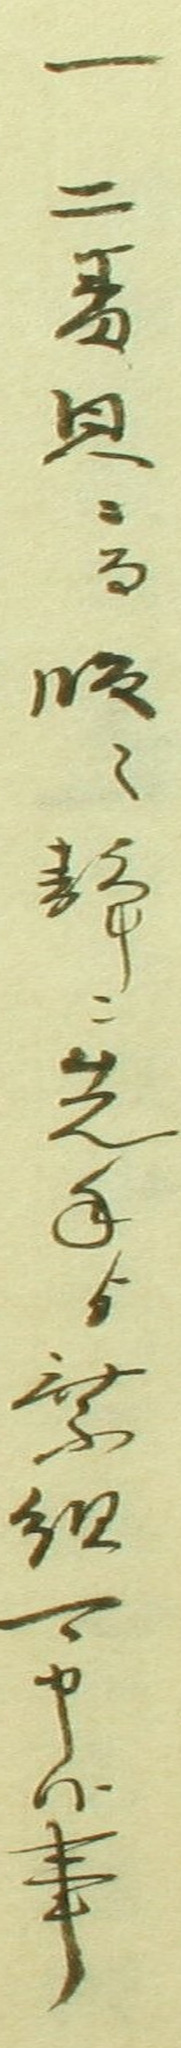一二番貝ニ而段々静ニ先手ゟ乗組可申候事
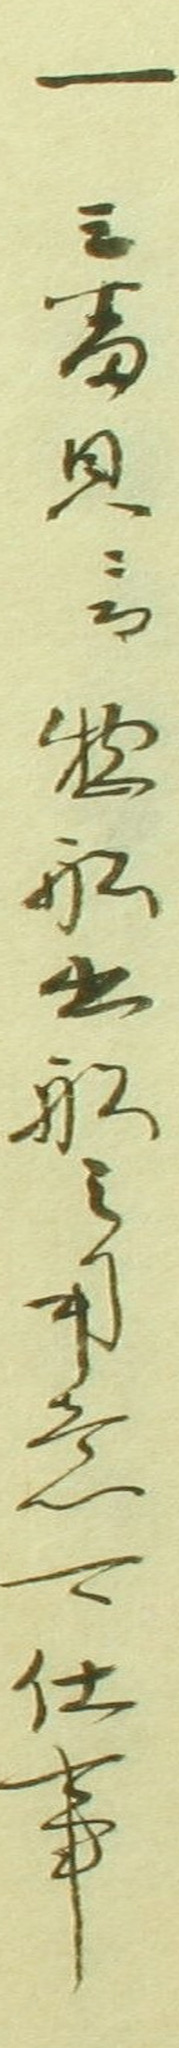一三番貝ニ而惣船出船之用意可仕事
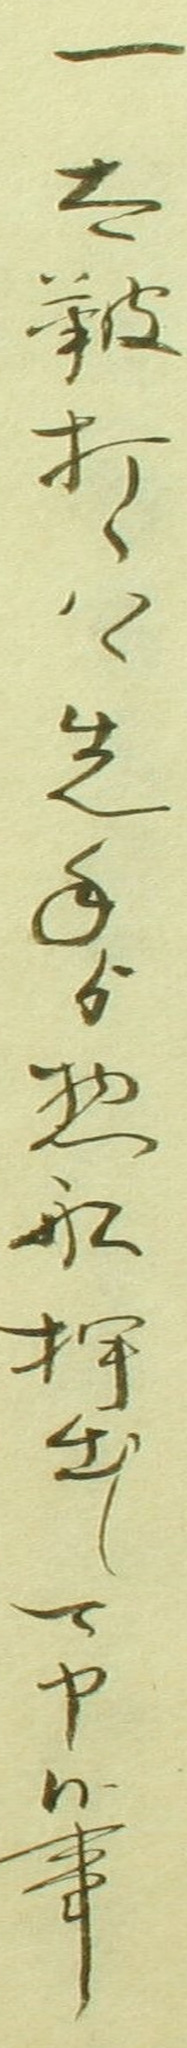一太鼓打候はゝ先手ゟ惣船押出し可申候事
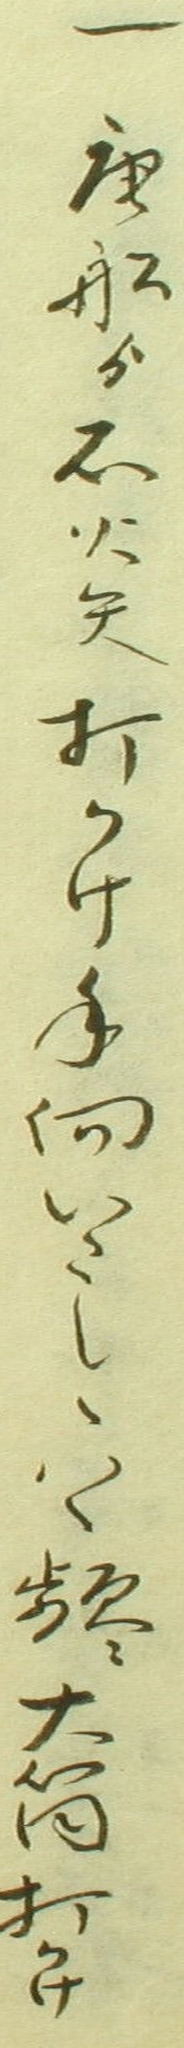一唐船ゟ石火矢打かけ手向いたし候はゝ頻に大筒打かけ
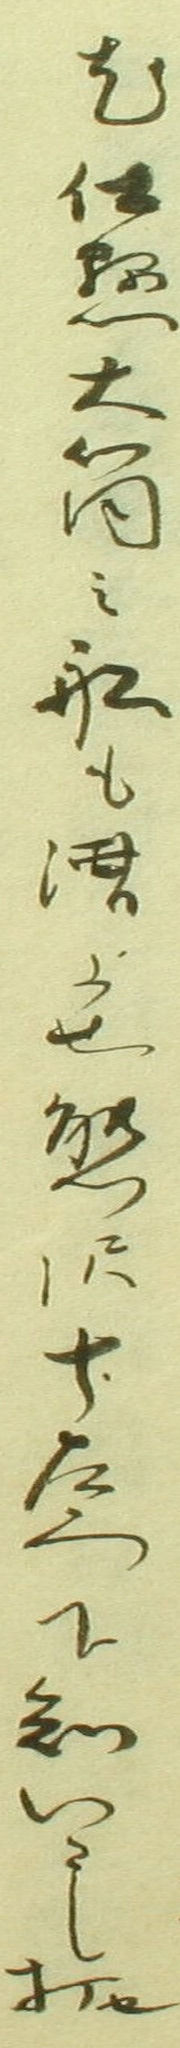尤仕懸大筒之船も漕よせ熊沢十郎左衛門下知いたし打せ
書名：唐船漂流記 二
